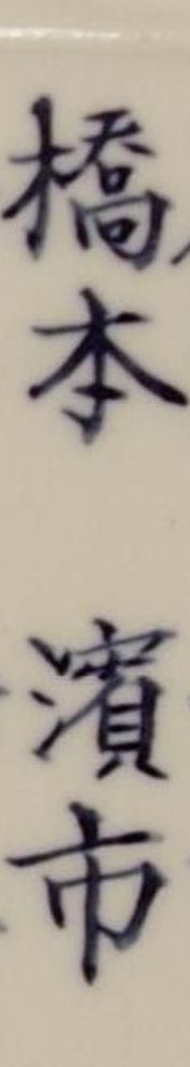橋本濱市
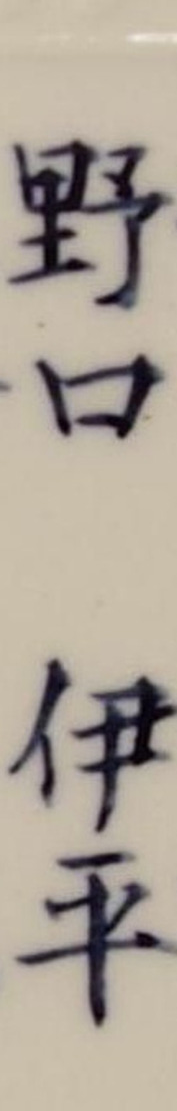野口伊平
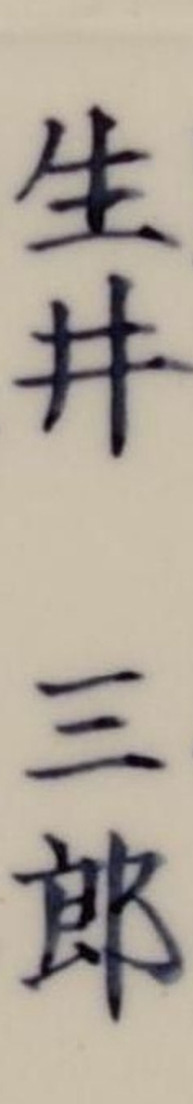生井三郎
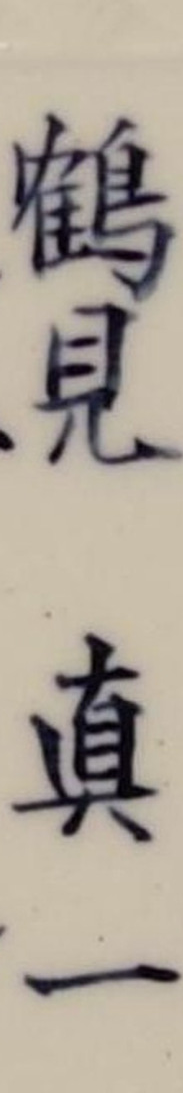鶴見真一
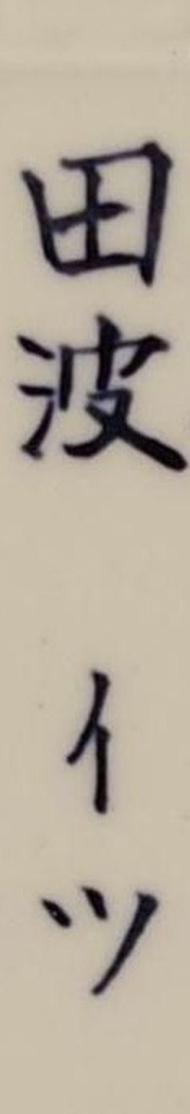田波イツ
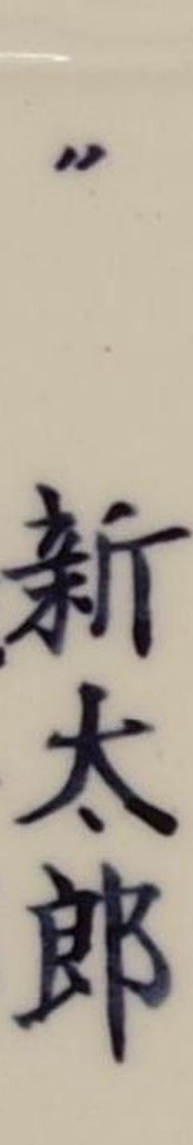新太郎
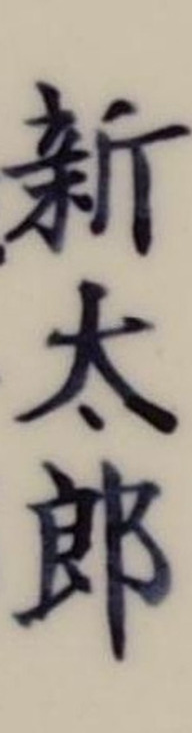新太郎
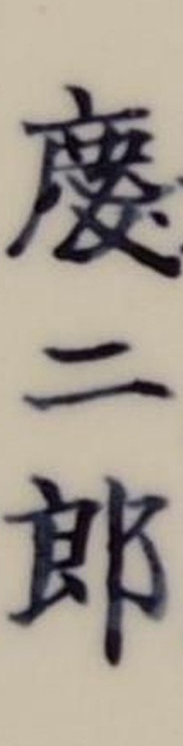慶二郎
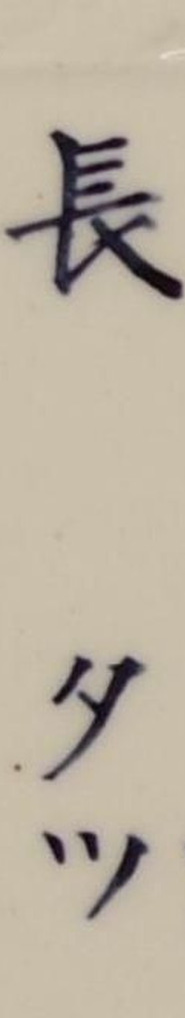長タツ
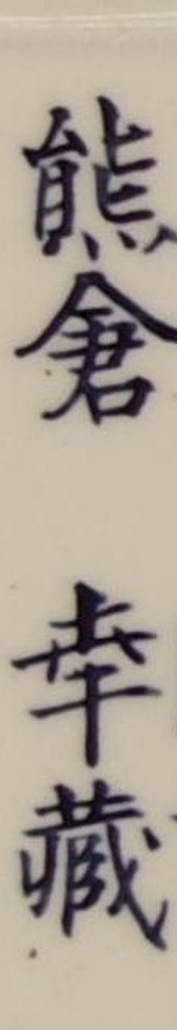熊倉幸蔵
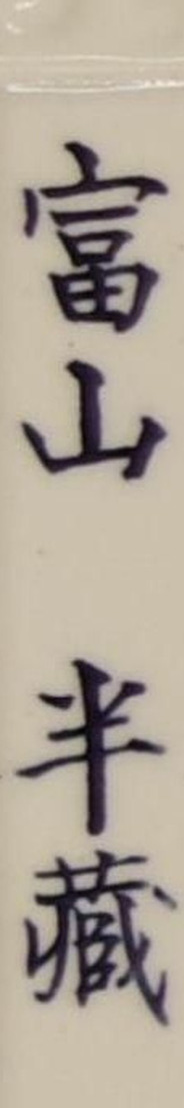富山半蔵

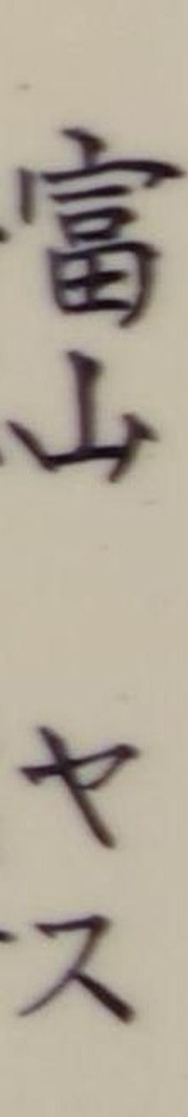富山ヤス
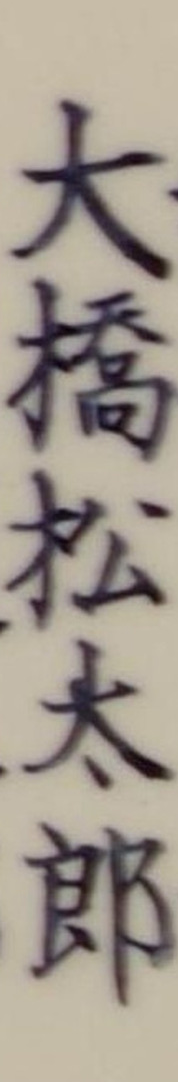大橋松太郎
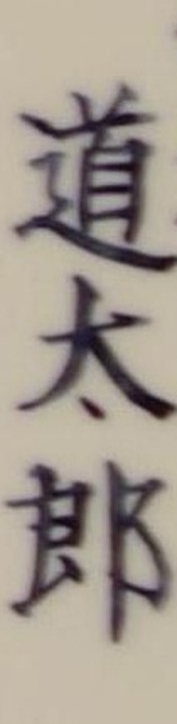道太郎
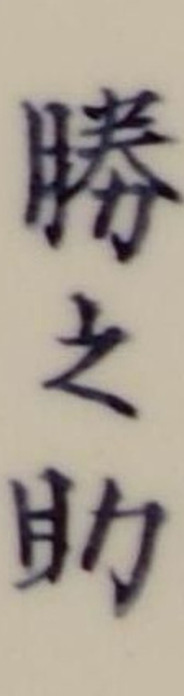勝之助
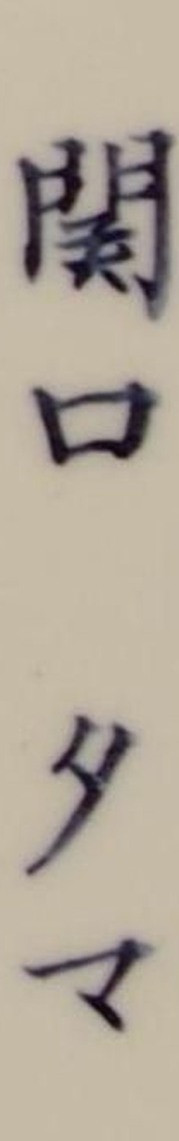関口タマ
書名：E~L
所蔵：高野山金剛峯寺
